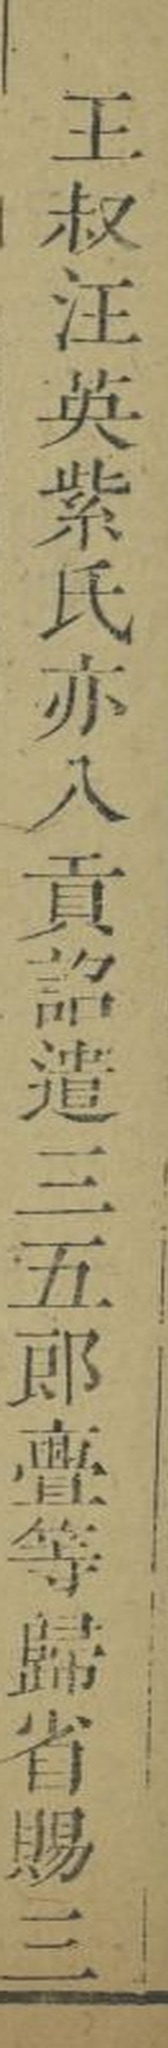王叔汪英紫氏亦入貢詔遣三五郎亹等帰省賜三
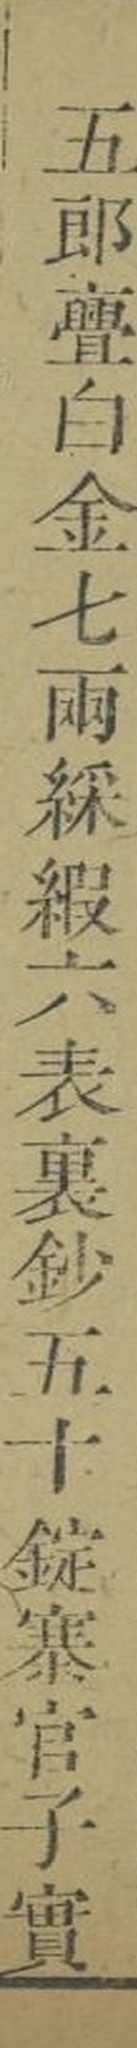五郎亹白金七両綵緞六表裏鈔五十錠寨官子実
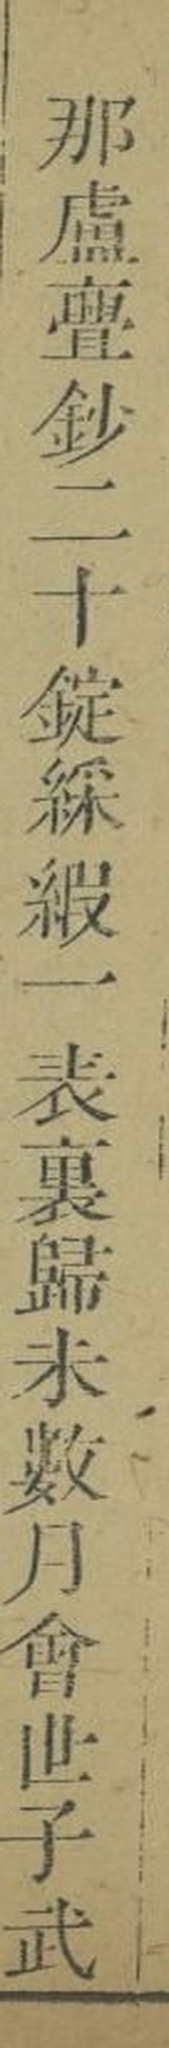那盧亹鈔二十錠綵緞一表裏帰未数月会世子武
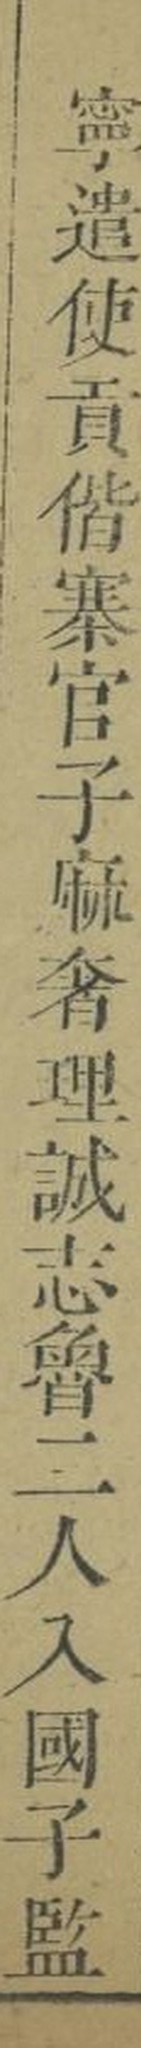寧遣使貢偕寨官子麻奢理誠志魯二人入国子監
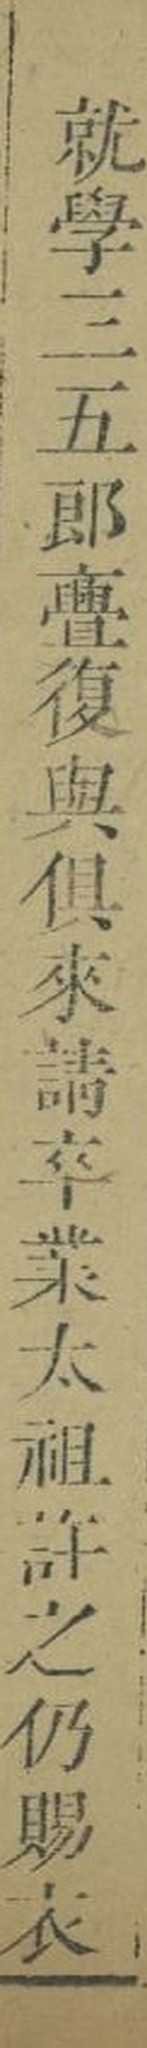就学三五郎亹復与俱来請卒業太祖許之仍賜衣
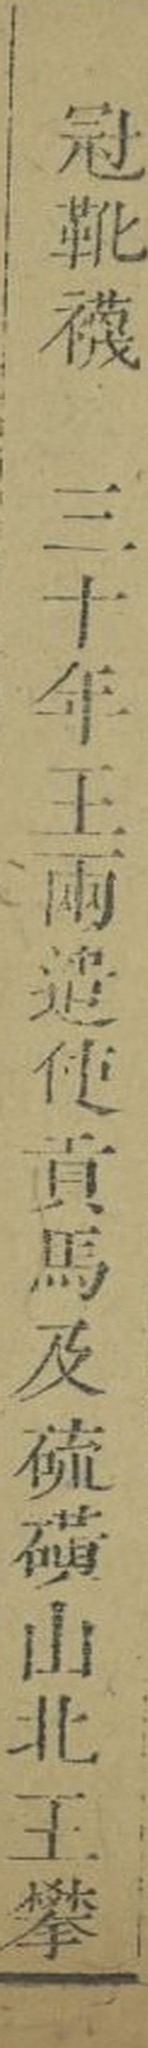冠靴襪三十年王両遣使貢馬及硫磺山北王攀
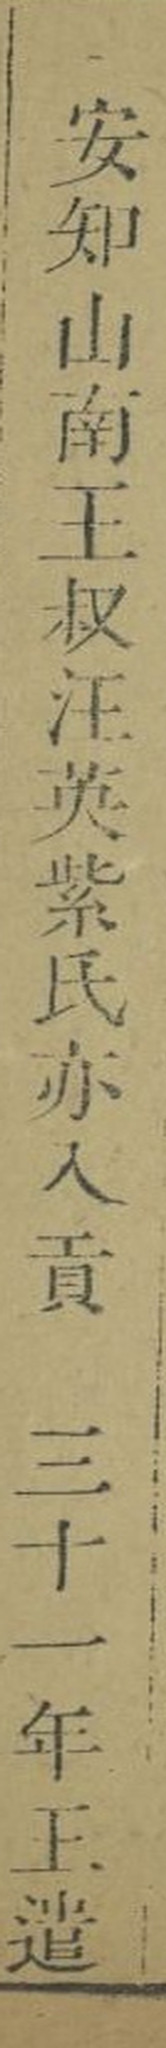安知山南王叔汪英紫氏亦入貢三十一年王遣
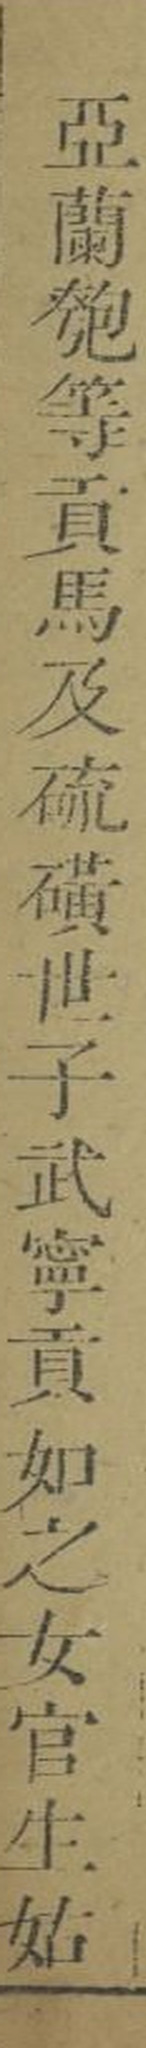亜蘭匏等貢馬及硫磺世子武寧貢如之女官生姑

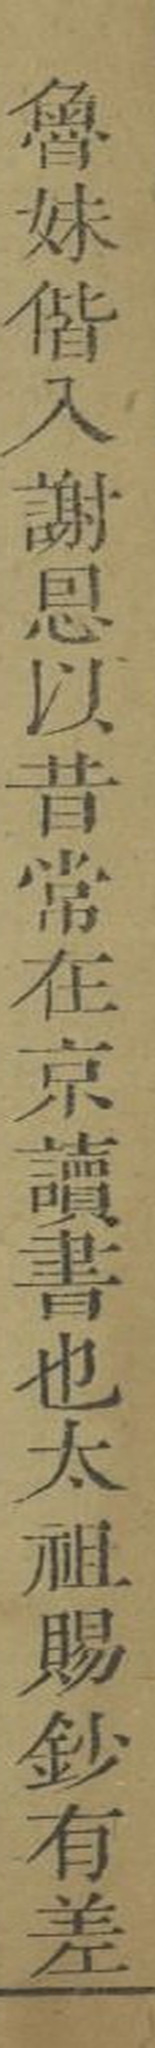魯妹偕入謝恩以昔常在京読書也太祖賜鈔有差
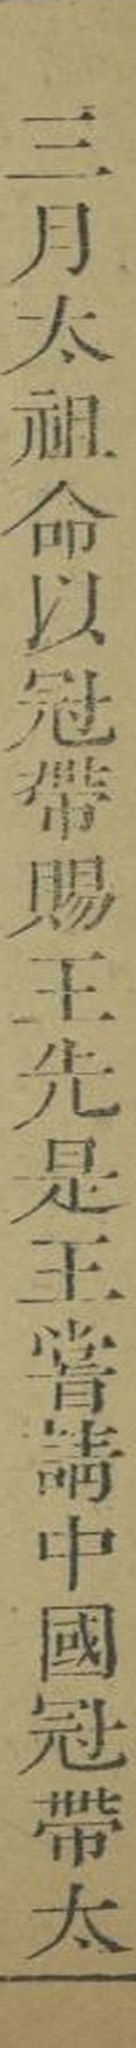三月太祖命以冠帯賜王先是王嘗請中国冠帯太
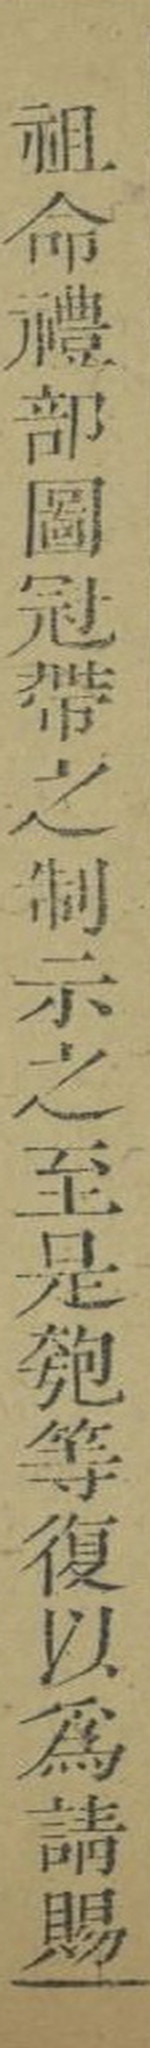祖命礼部図冠帯之制示之至是匏等復以為請賜
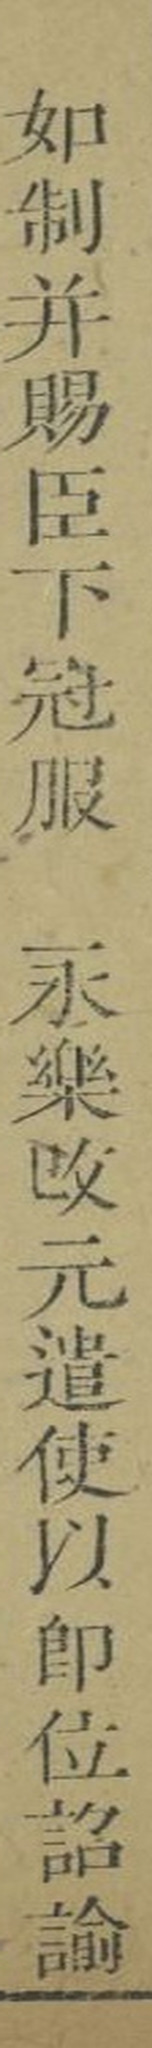如制并賜臣下冠服永楽改元遣使以即位詔諭
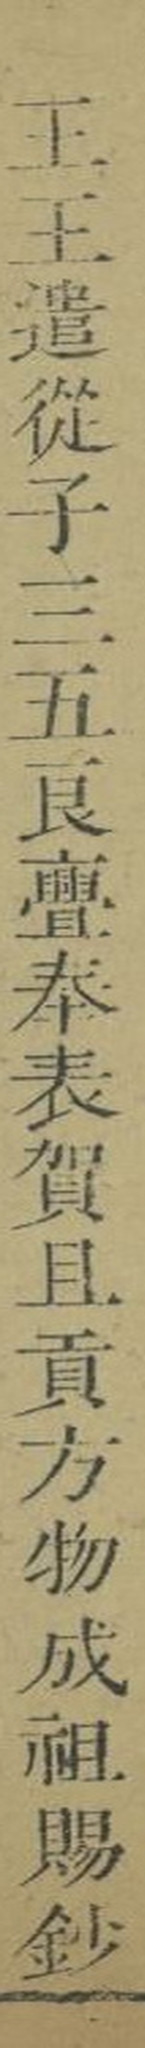王王遣従子三五良亹奉表賀且貢方物成祖賜鈔
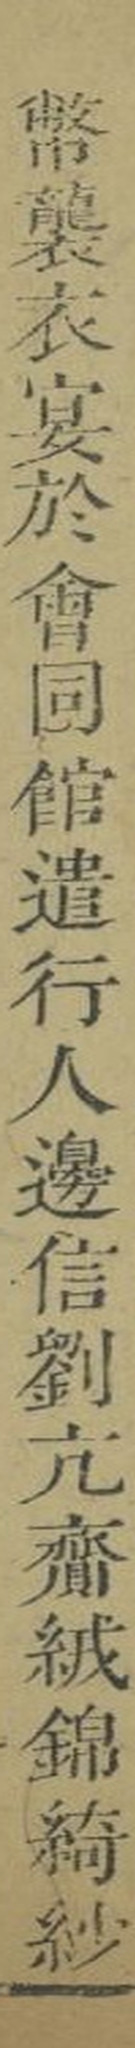幣襲衣宴於会同館遣行人辺信劉亢齎絨錦綺紗
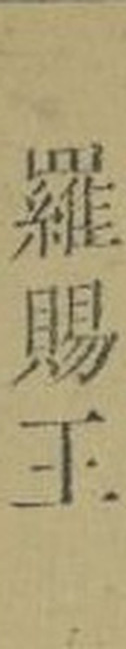羅賜王
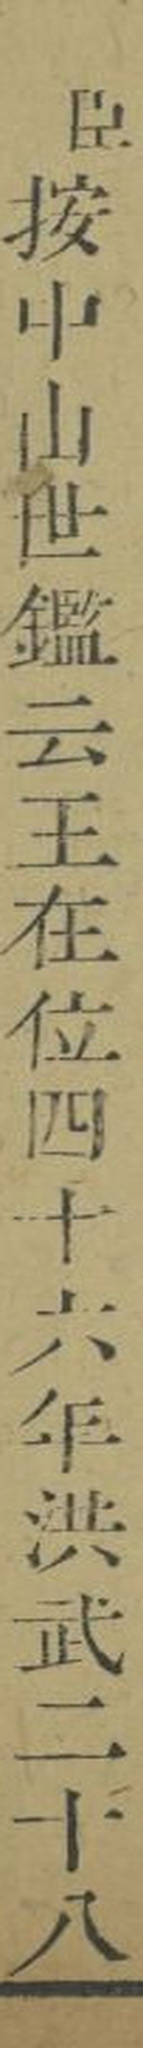臣按中山世鑑云王在位四十六年洪武二十八
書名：中山伝信録 巻三
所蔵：University of the Ryukyus Library
